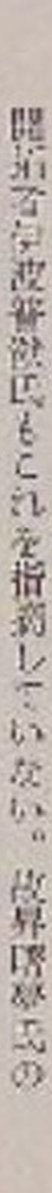開拓者伊波普猷氏もこれを指摘していない。故昇曙夢氏の
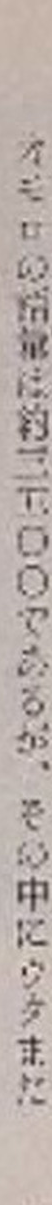オモロの語彙は約三五〇〇であるが、その中にウタまた
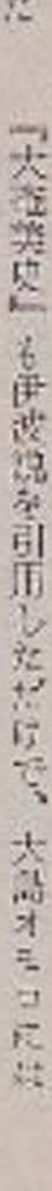『大奄美史』も伊波説を引用しただけで、大島オモロには
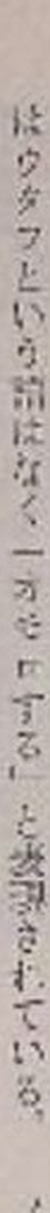はウタフという語はなく「オモロする」と表現されている。
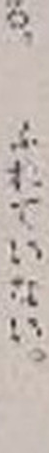ふれていない。
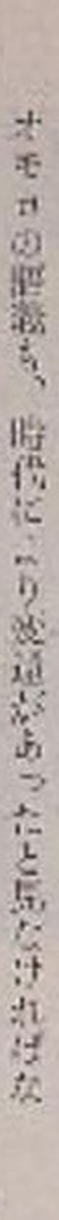オモロの語義も、時代により変遷があったと見なければな
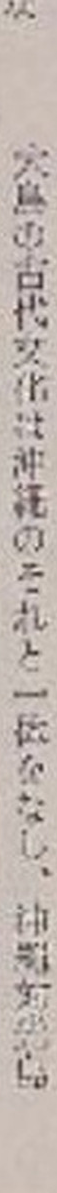大島の古代文化は沖縄のそれと一体をなし、沖縄対先島
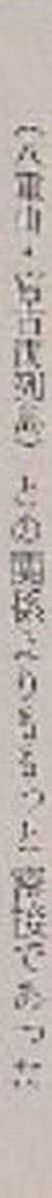(八重山・宮古両列島)との関係よりももっと密接であった
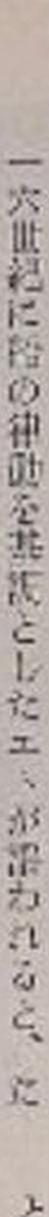一六世紀に船の律動を基調としたエトが謡われると、た
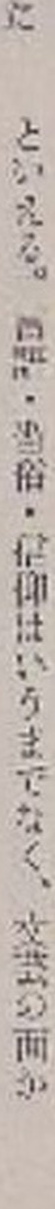といえる。言語・習俗・信仰はいうまでなく、文芸の面か
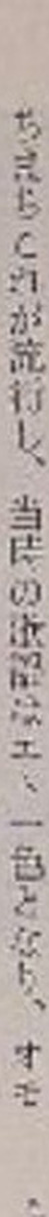ちまちこれが流行し、当時の歌謡はエト一色となり、オモ
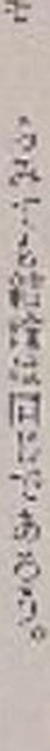らみても結論は同じであろう。
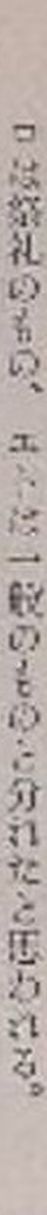ロは祭礼のもの、エトは一般のものと分れたと思われる。
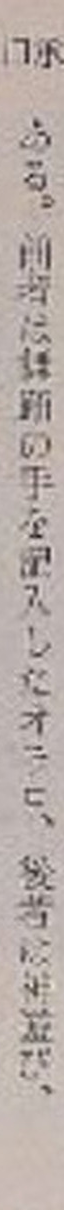ある。前者は舞踊の手を記入したオモロ、後者は遊び、
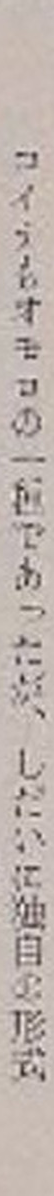コイナもオモロの一種であったが、しだいに独自の形式
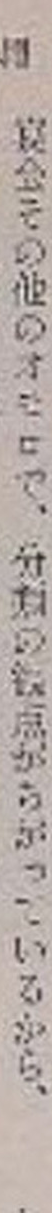宴会その他のオモロで、分類の観点がちがっているから、
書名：沖縄口承文芸
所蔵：University of the Ryukyus Library
